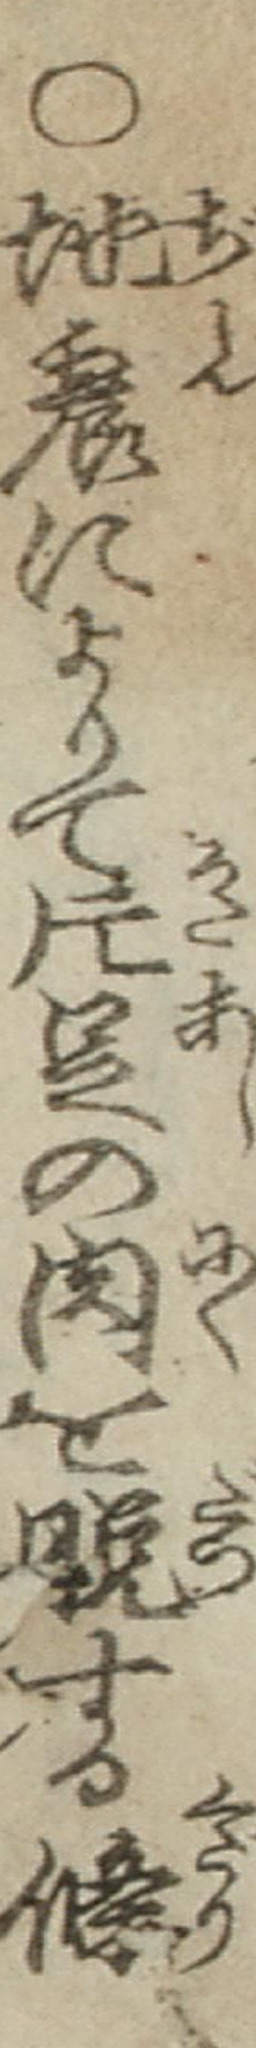◯地震によりて片足の肉を脱する條
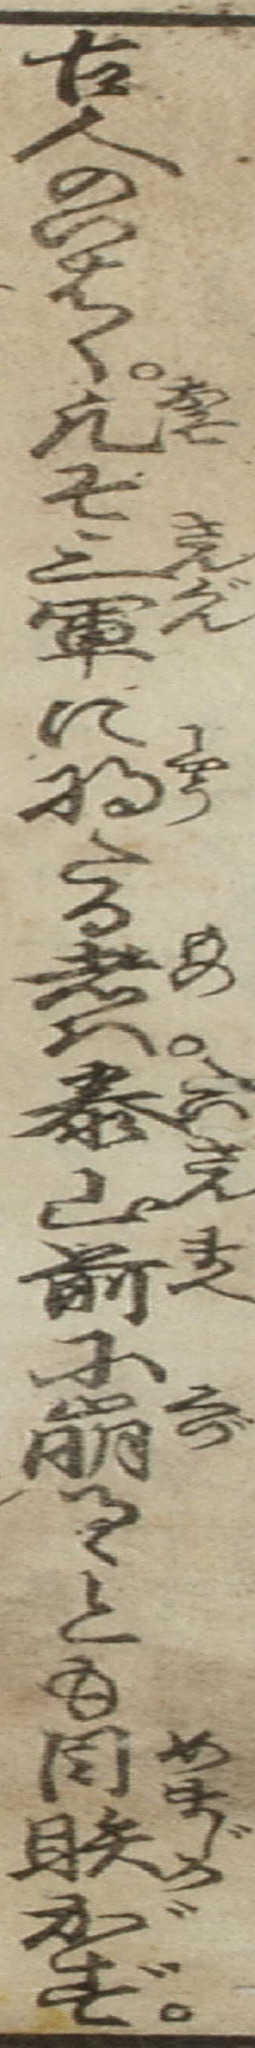古人のいはく。凡三軍に将たる者は。泰山前に崩るゝとも目瞬がず。
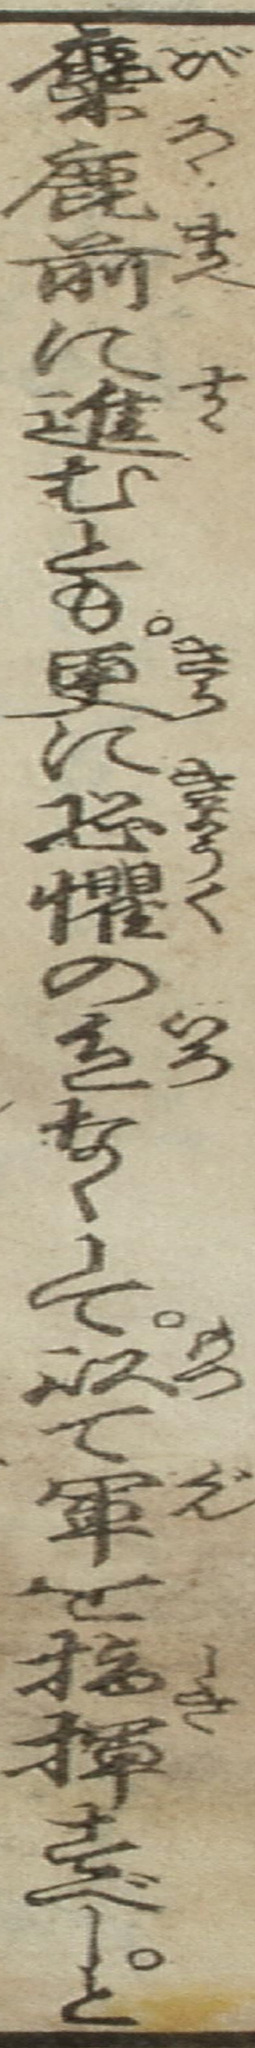麋鹿前に進むとも。更に恐懼の色なくして以て軍を指揮すべし。と
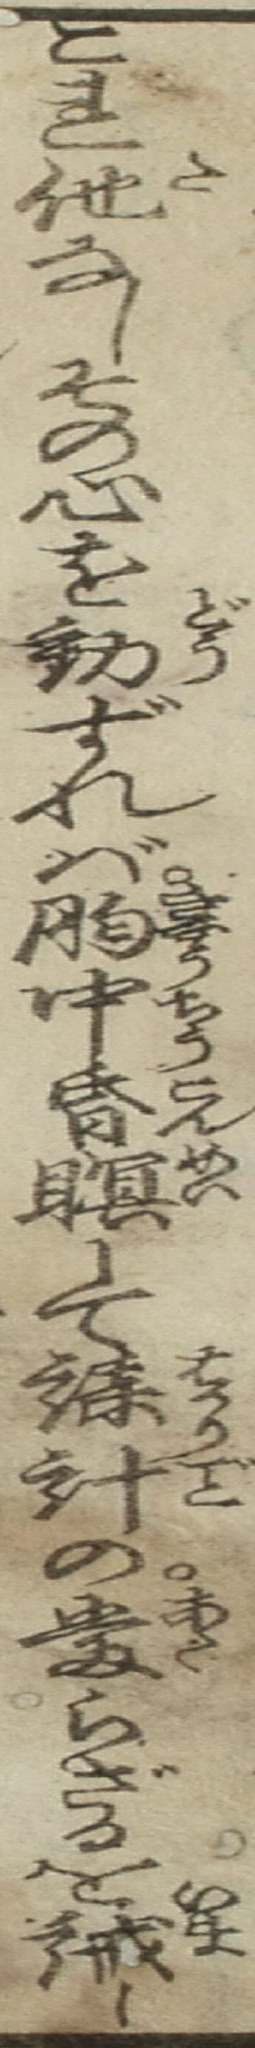これ他なしその心を動ずれば胸中昏瞑して謀計の。当らざるを戒し
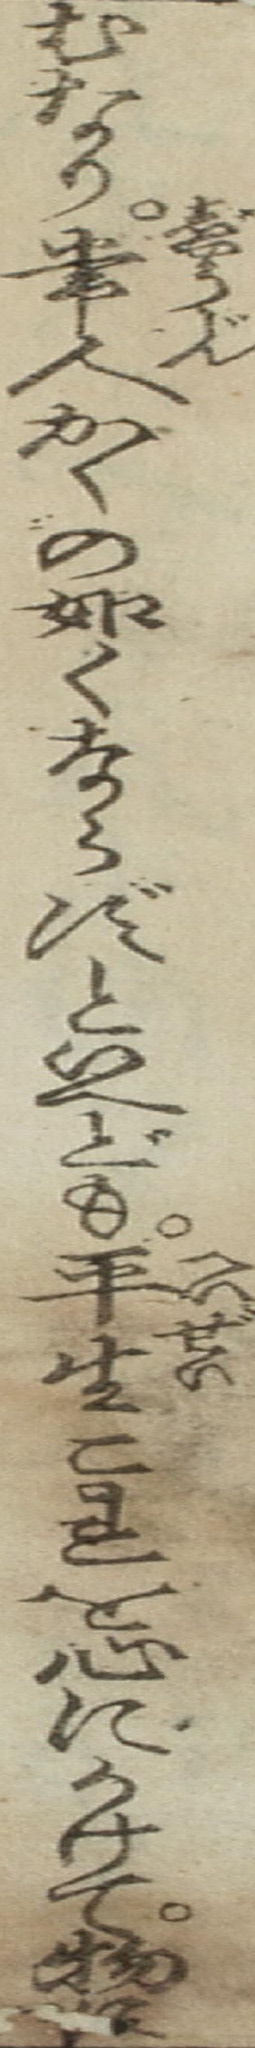むなり。常人かくの如くならずといへども。平生これを心にかけて。物に
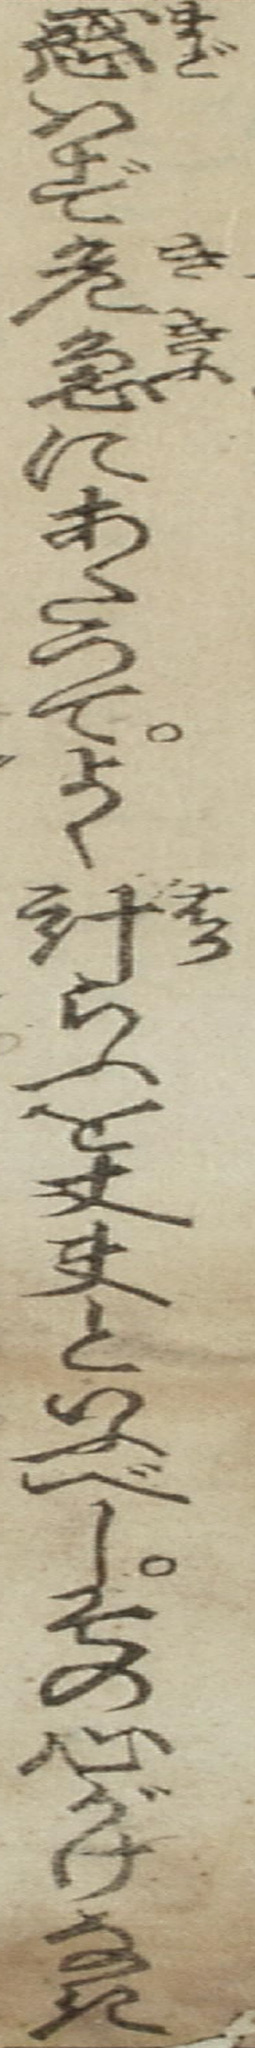惑はず危急にあたつて。よく計らふを丈夫といふべし。その心がけなき
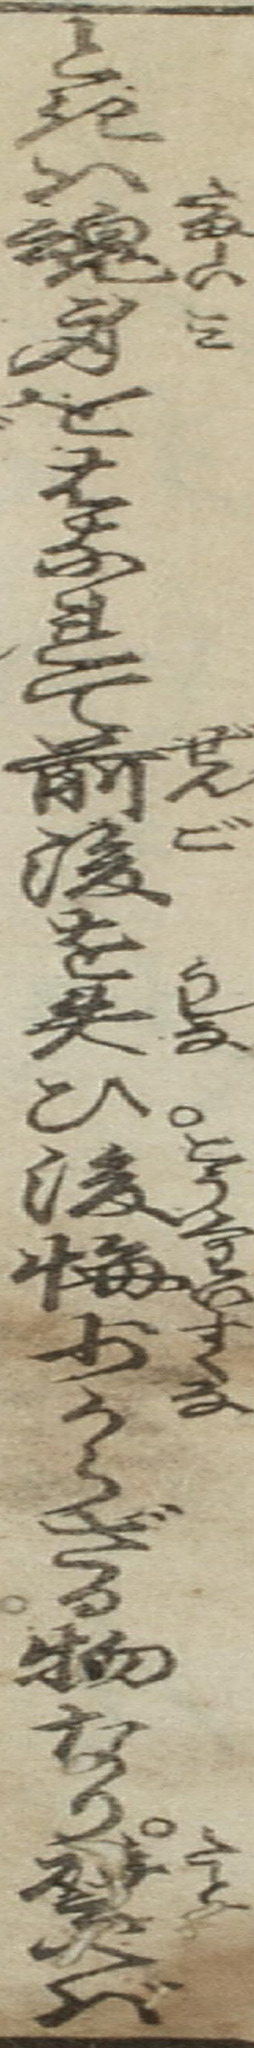ときは魂身をはなれて前後を失ひ。後悔少からざる物なり。譬へば
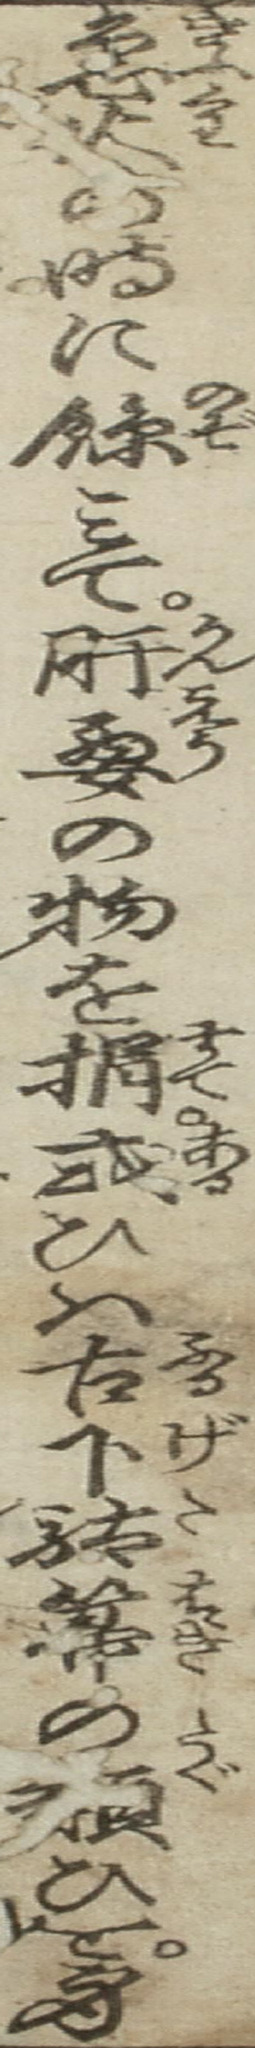急火の時に臨みて。肝要の物を捐。或ひは古下駄箒の類ひを。身
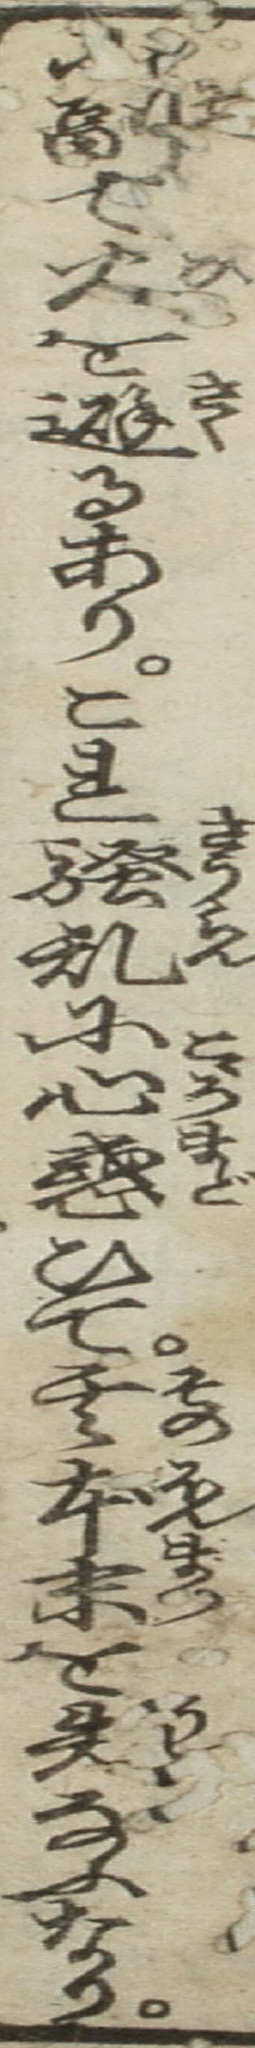に副て火を避る事あり。これ騒乱に心惑ひて。其本末を失なふなり。
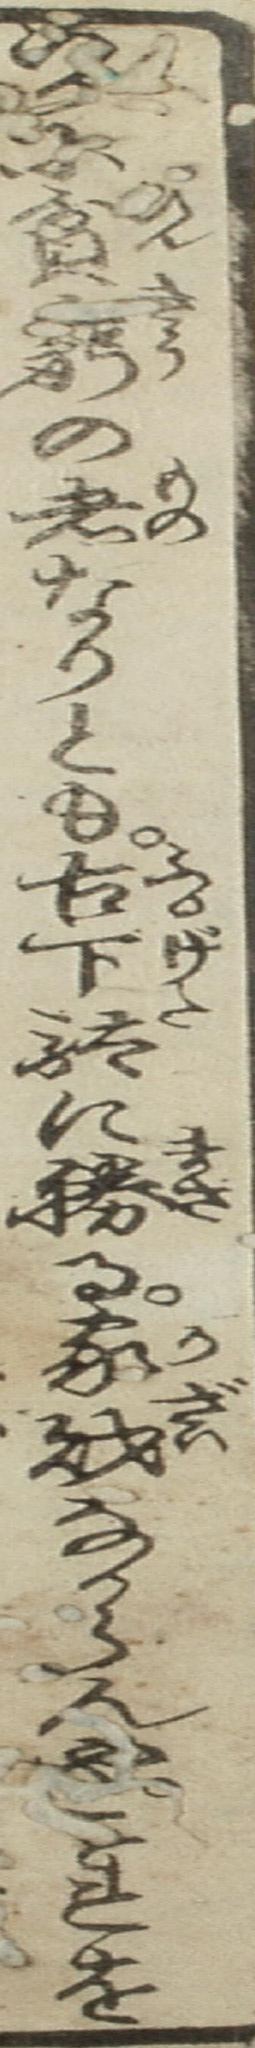いかに貧窮の者なりとも。古下駄に勝る。家財なからんや。これを
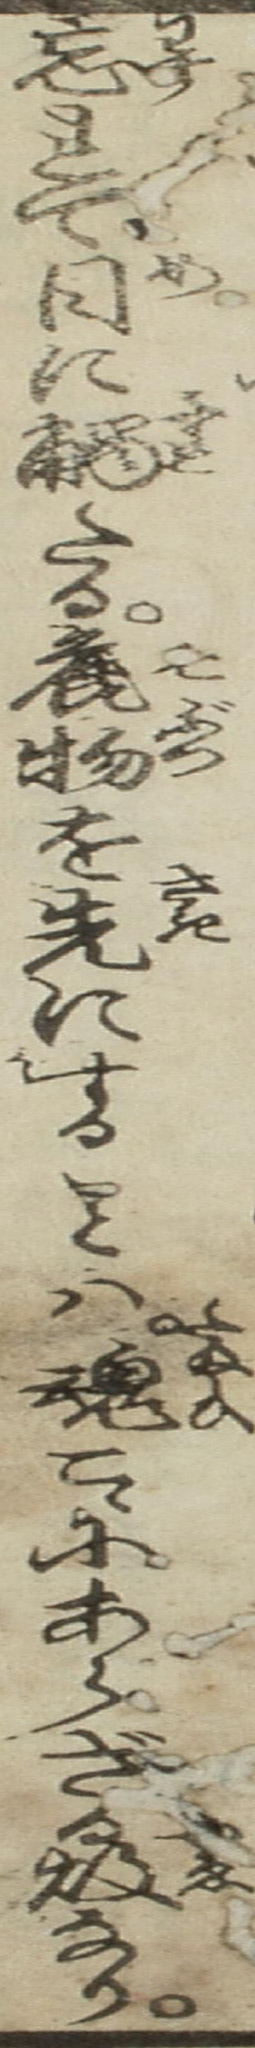忘れて目に觸たる麁物を先にすることは。魂こゝにあらざる故なり。
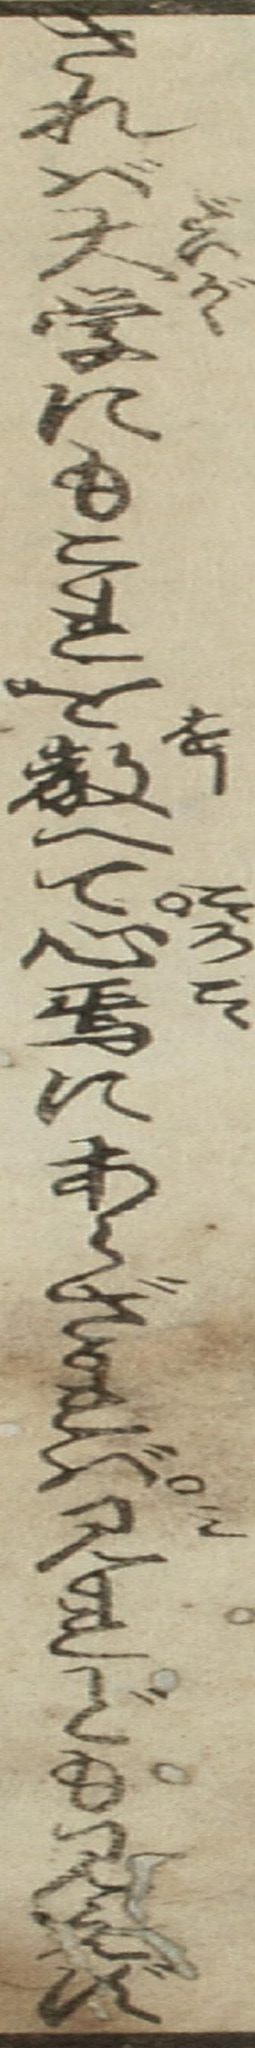されば大学にもこれを教へて。心焉にあらざれば。見れども見えず
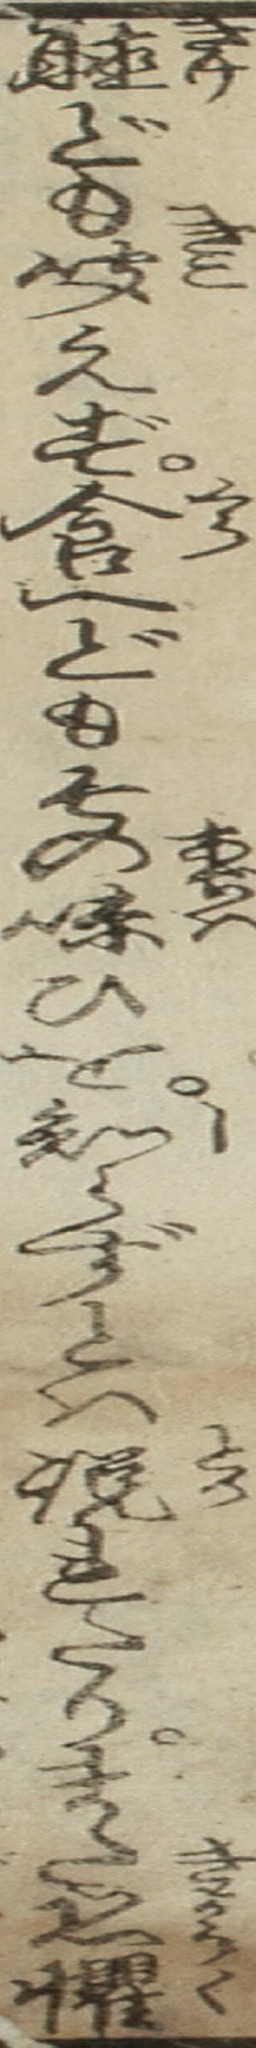聴ども聞えず。食へどもその味ひを。知らずとは説れたり。また恐懼
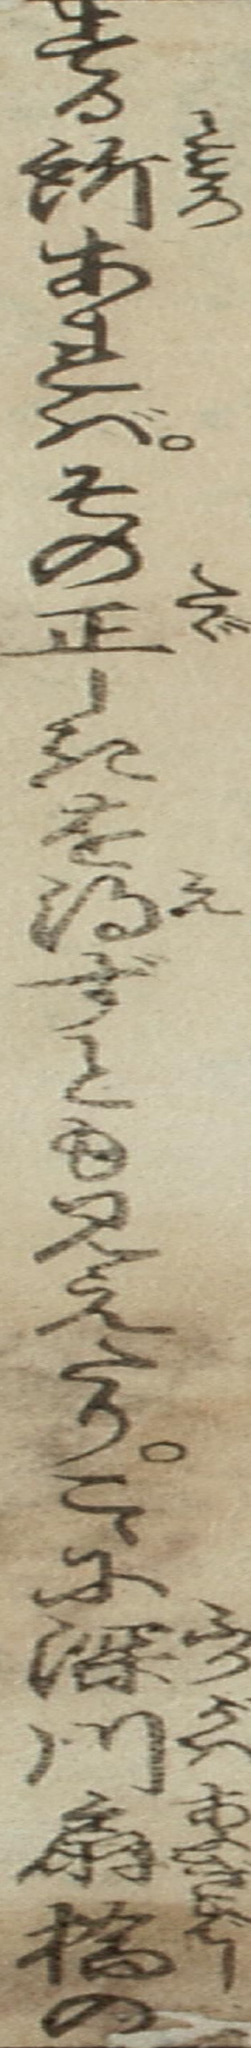する所あれば。その正しきを得ずとも見えたり。こゝに深川扇橋の
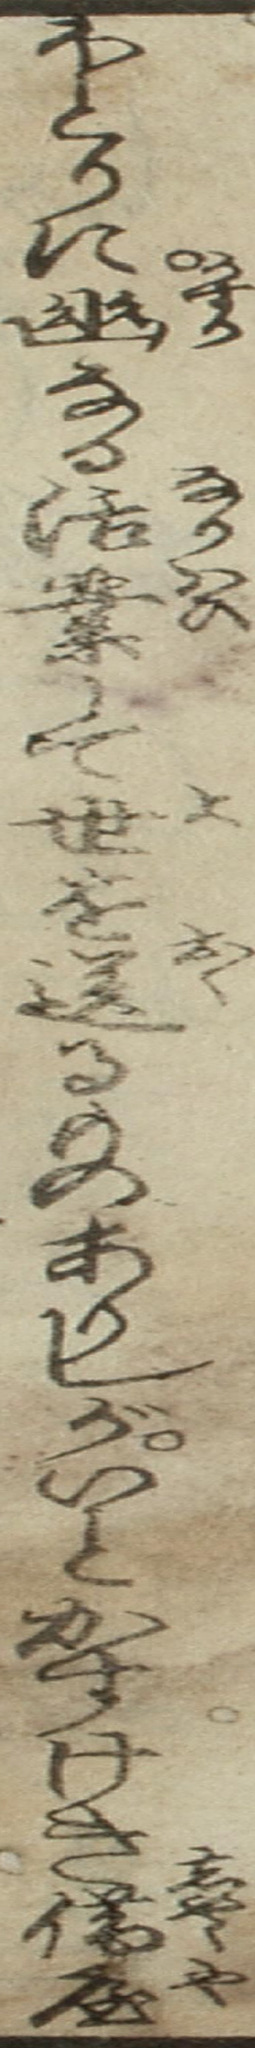ほとりに。幽なる活業して世を送るものものありしが。いとかすけき借屋
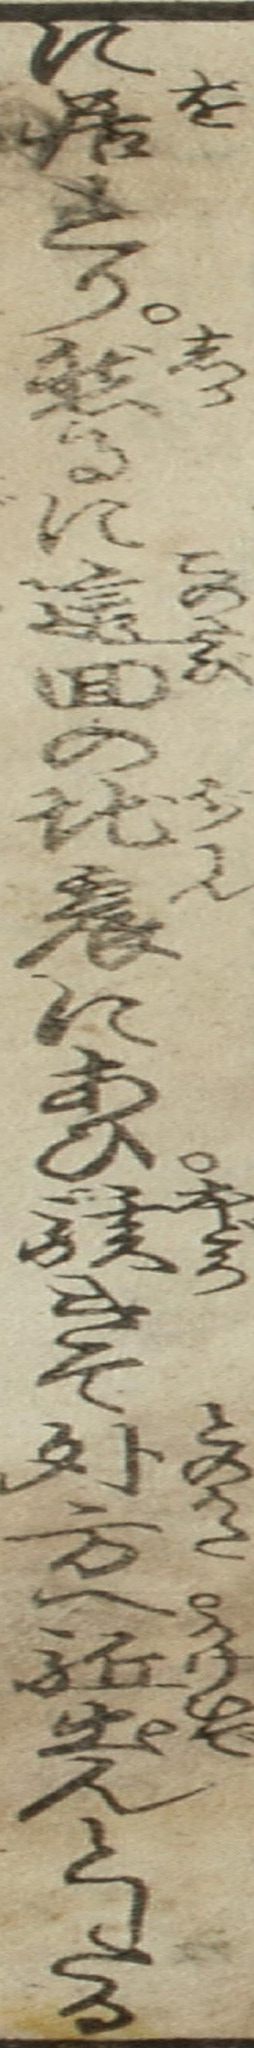に居れり。然るに這回の地震にあひ。駭きて外方へ駈出んとしたる
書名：安政見聞録　中
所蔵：東京大学地震研究所図書室 Earthquake Research Institute Library, The University of Tokyo, JAPAN
